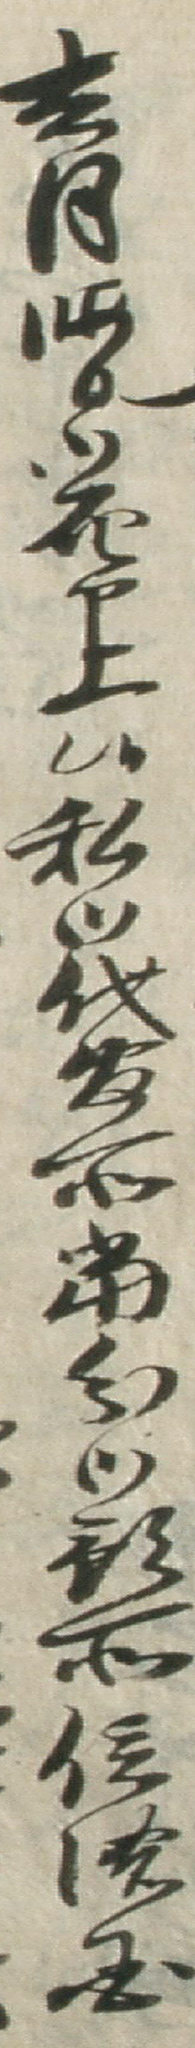去月晦日御届申上候私御代官所当分御預所信濃国
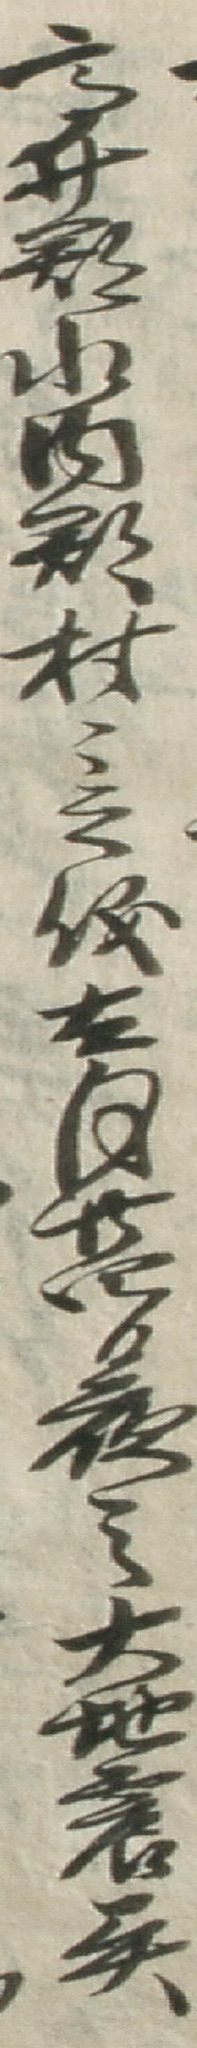高井郡水内郡村々之儀去月廿四日ゟ夜々大地震異
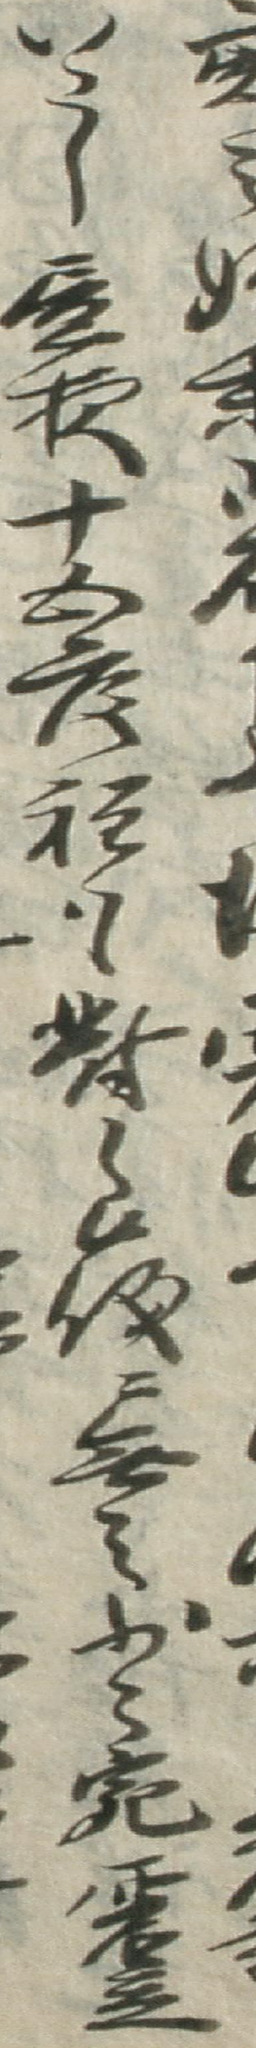いたし昼夜十五度程も対し候儀二無之少々宛震立
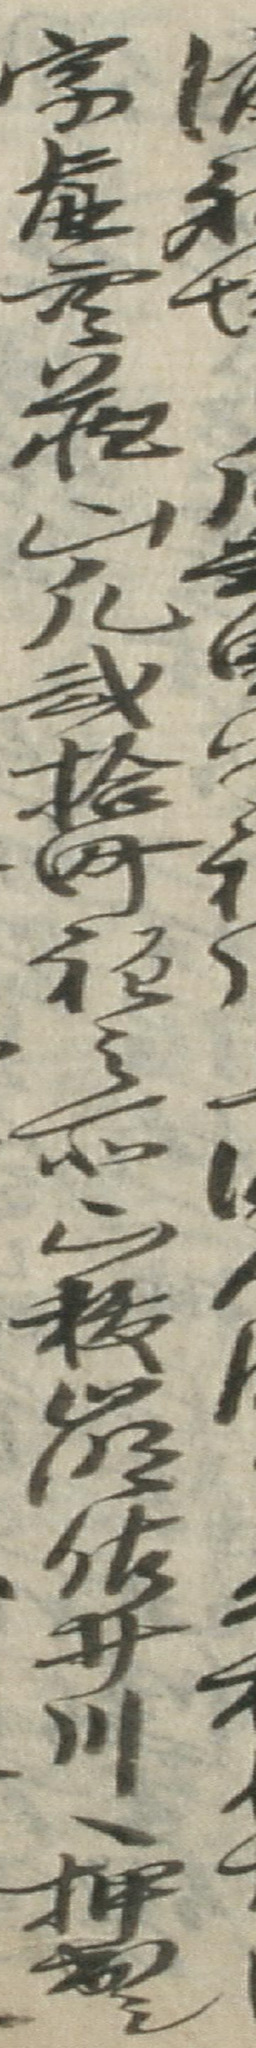字虚空蔵山凡廿丁程之所山抜崩佐井川へ押出ㇱ
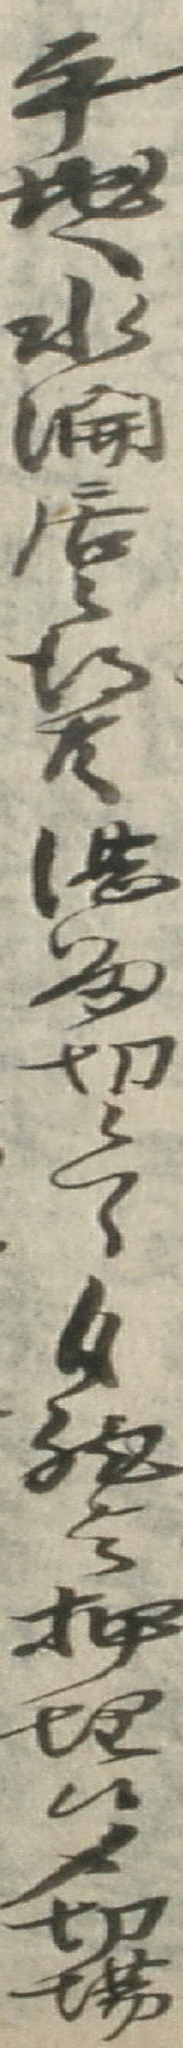平地へ水開居候得共湛留切二て自然と押埋候〆
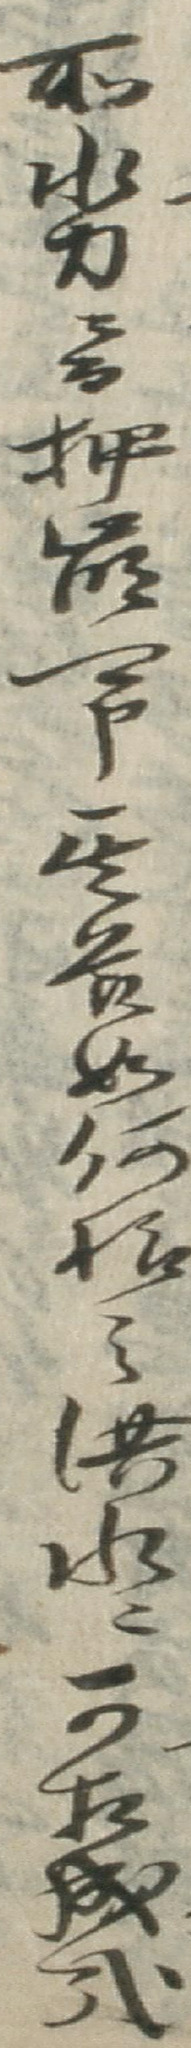所水力二而押崩可申其節如何様之洪水二可相成哉
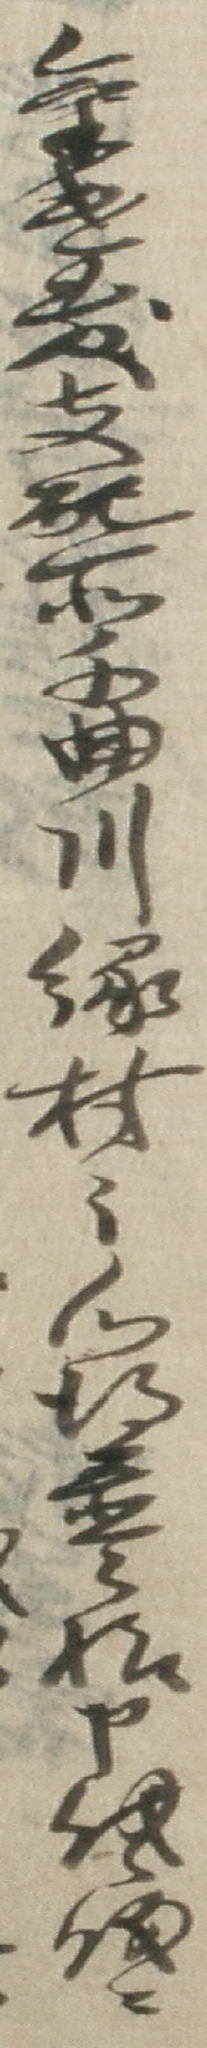気遣敷支配所千曲川縁村々心得置候様申越候儀二
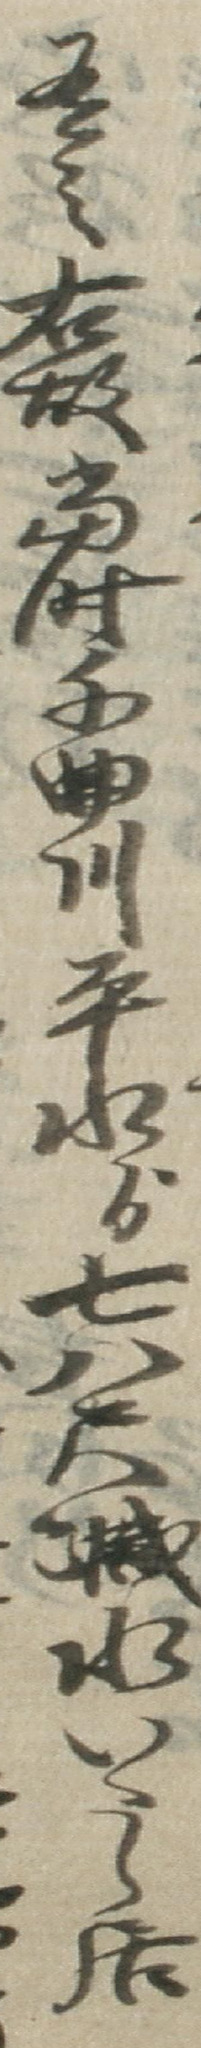右故当時千曲川平水ゟ七八尺減水いたし居
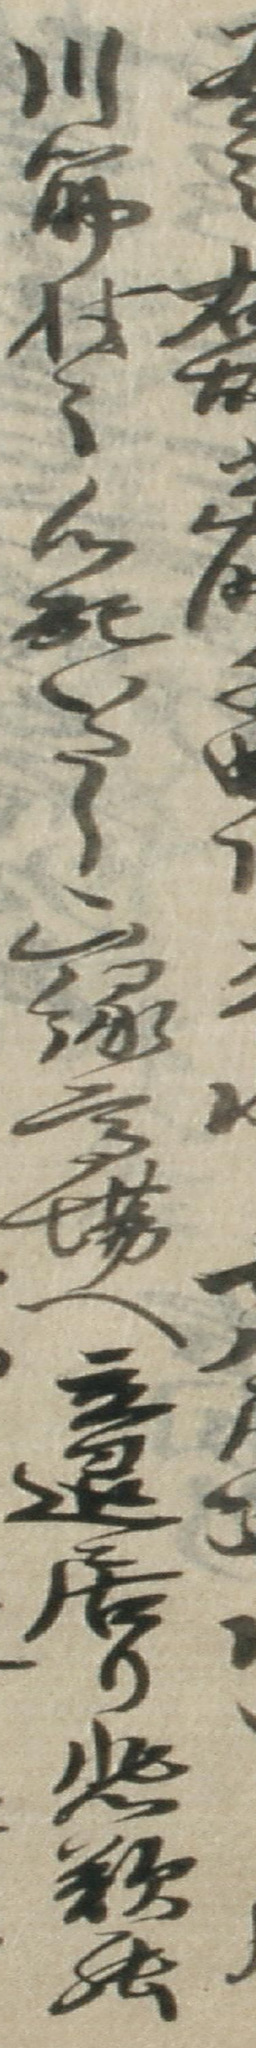川筋村々心配いたし山添高場へ立退居り悲歎罷
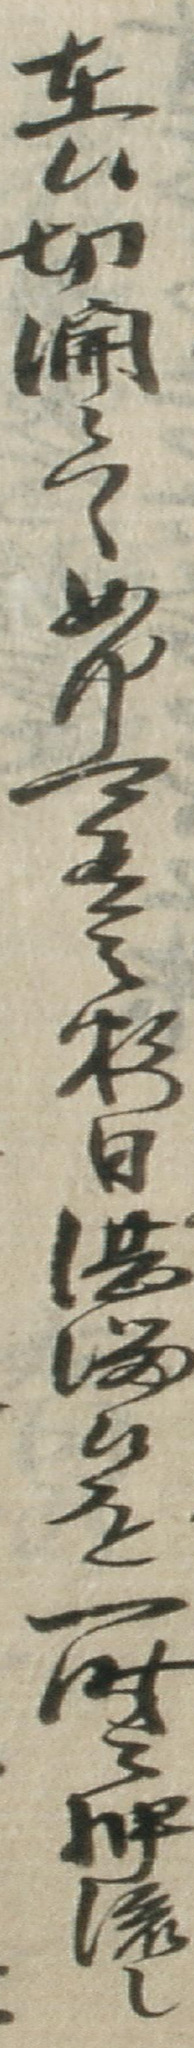在候切開候ハゝ如何可有之候哉数日湛留候を一時二押し
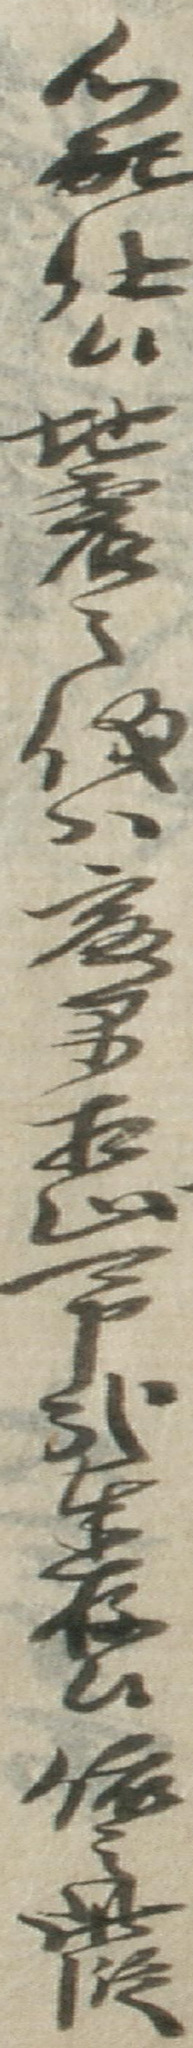心配仕候地震之儀ハ最早相止可申哉奉存候依之此段
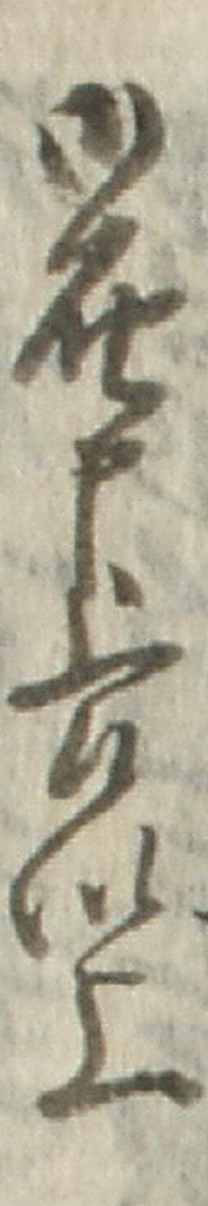御届申上候以上
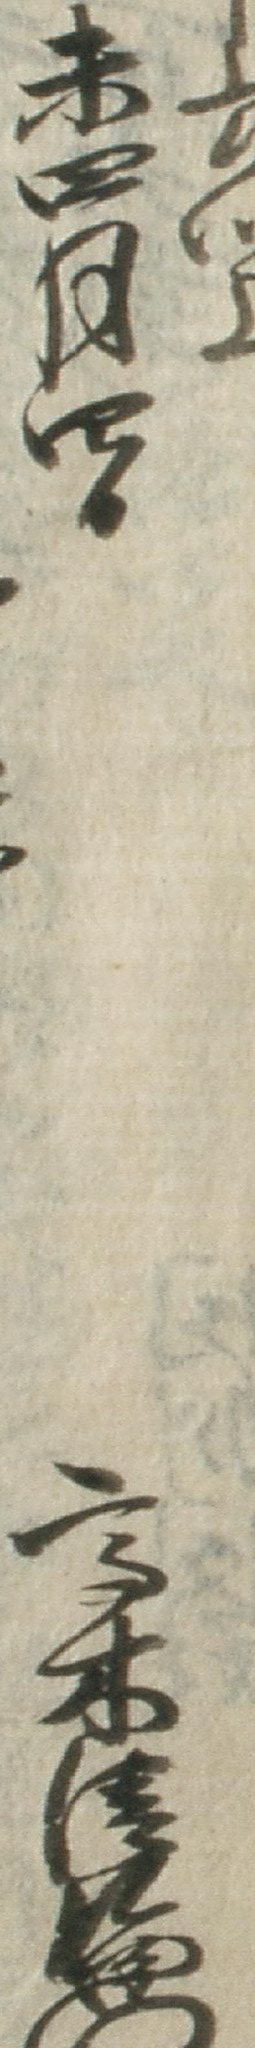未四月四日高木清左衛門
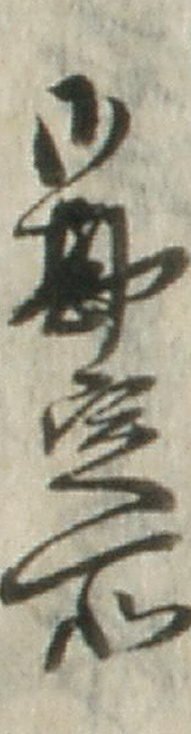御勘定所
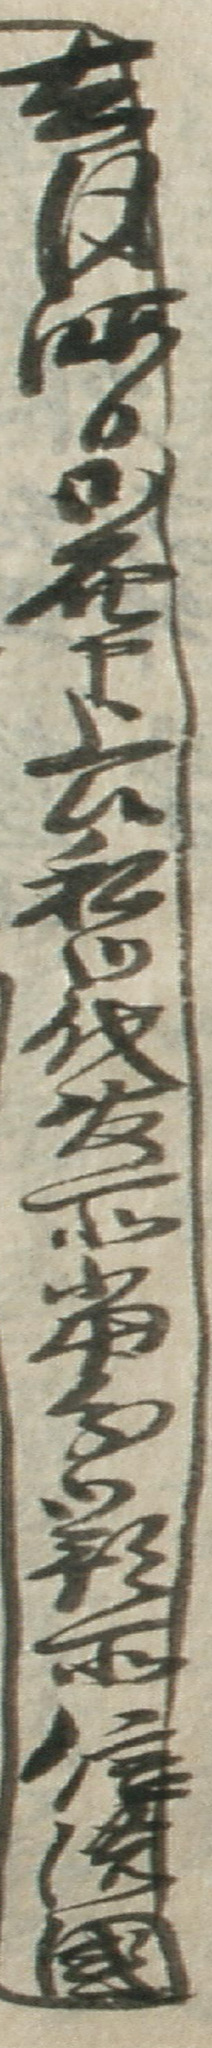去月晦日御届申上候私御代官所当分御預所信濃国
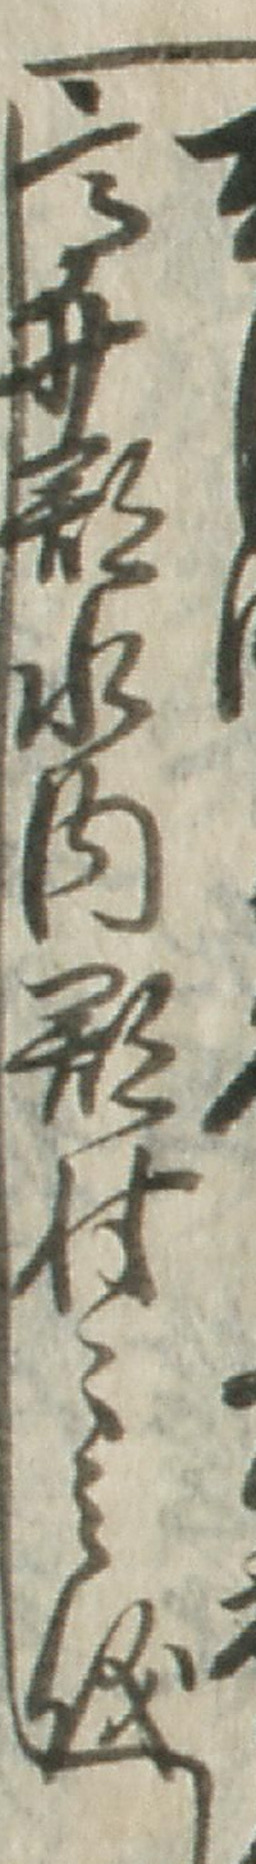高井郡水内郡村々之儀
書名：信濃國地震實録記
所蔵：東京大学地震研究所図書室 Earthquake Research Institute Library, The University of Tokyo, JAPAN
